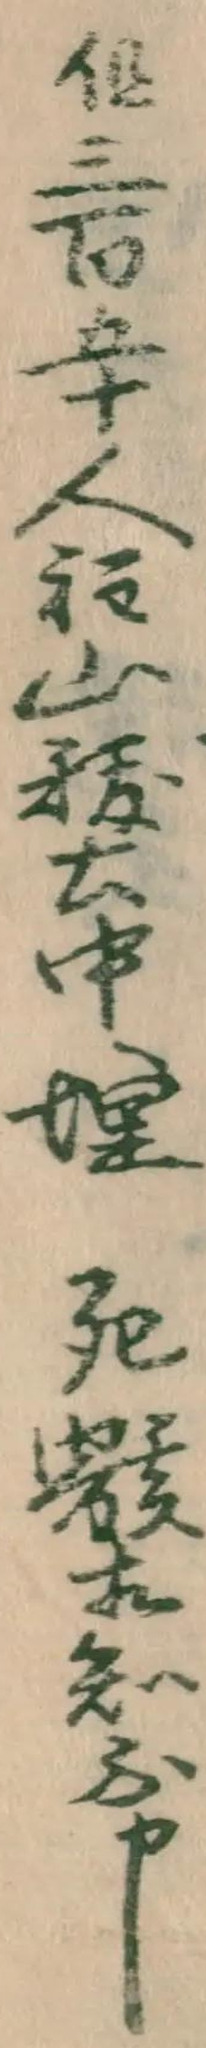但三百五十人程山抜土中へ埋死骸相知不申
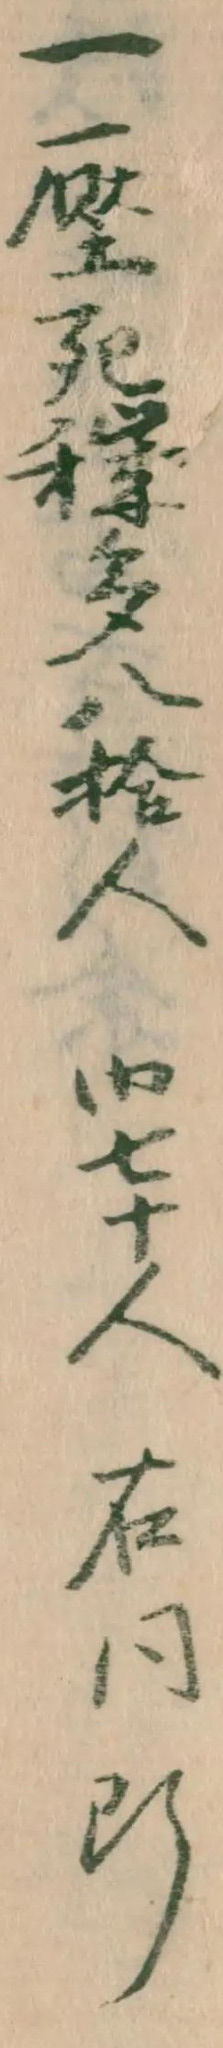一圧死人穢多八拾人内七十人右同断
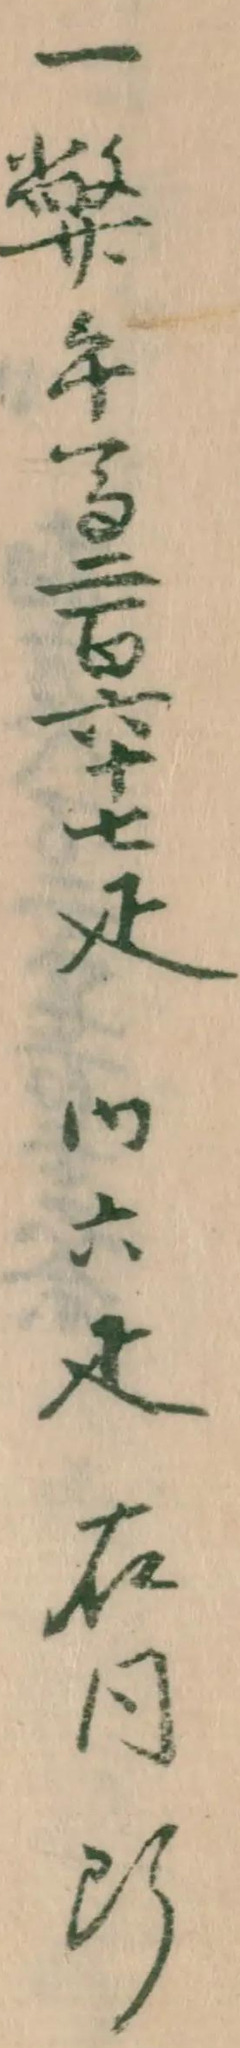一弊牛馬二百六十七疋内六疋右同断
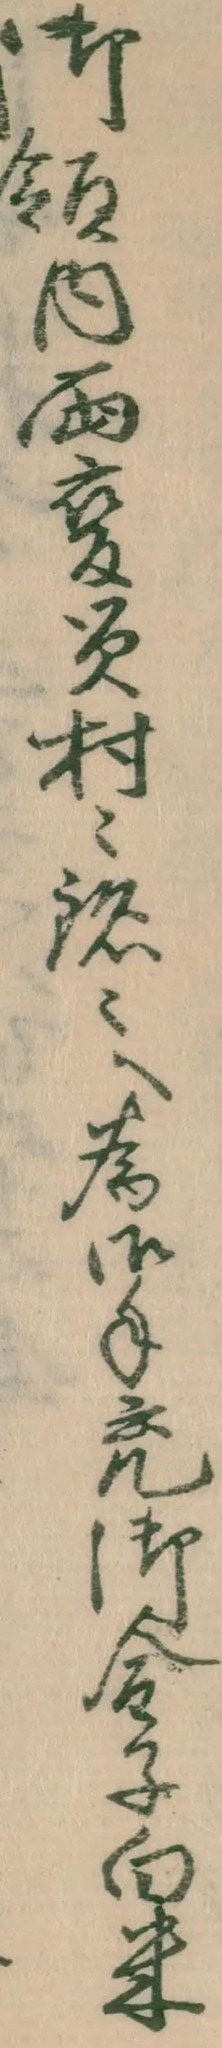御領内両変災村々銘々へ御手充御金子白米
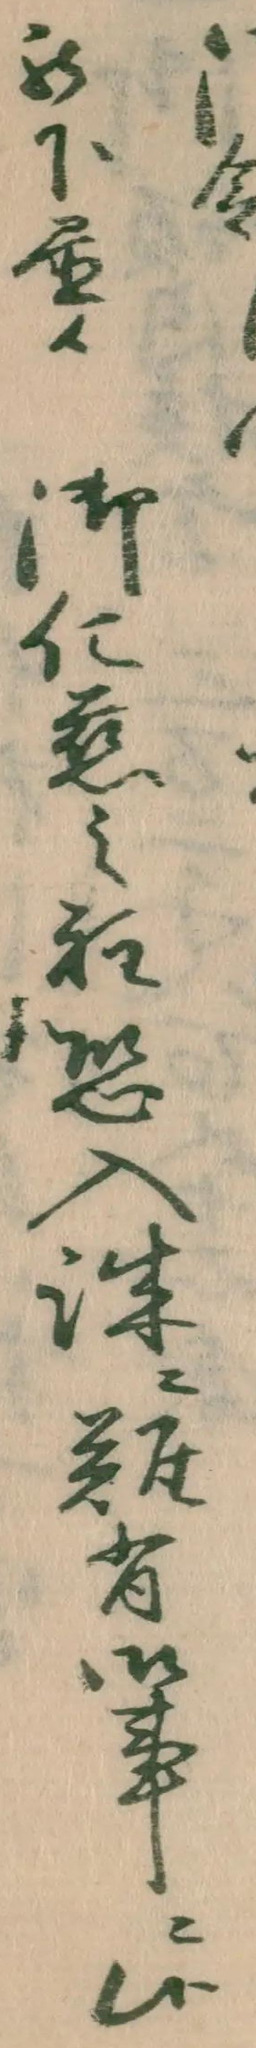被下置候御仁恵之程恐入誠二難有御事二候

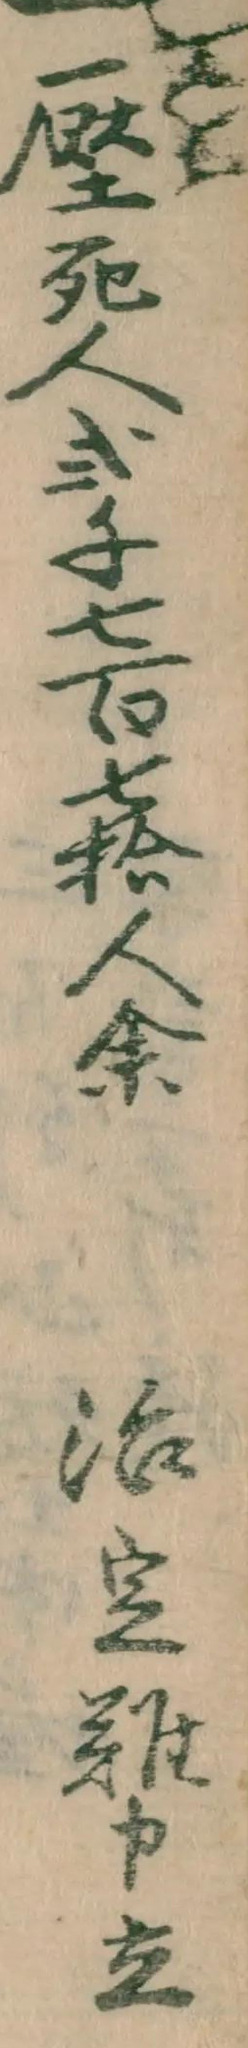一圧死人弐千七百七拾人余治定難申立
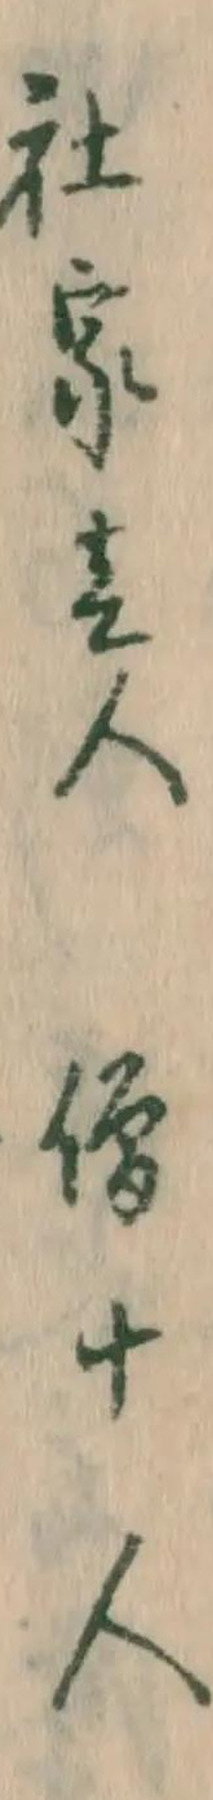社家壱人僧十人
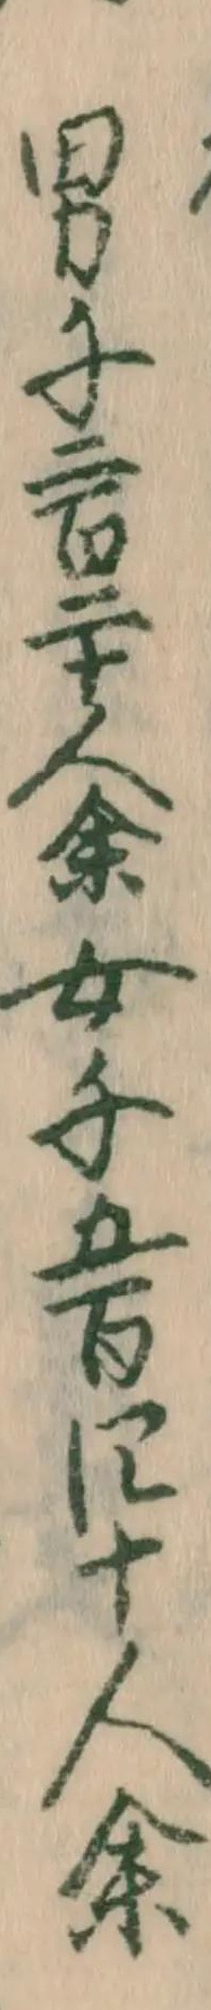内男千二百二十人余女千五百四十人余
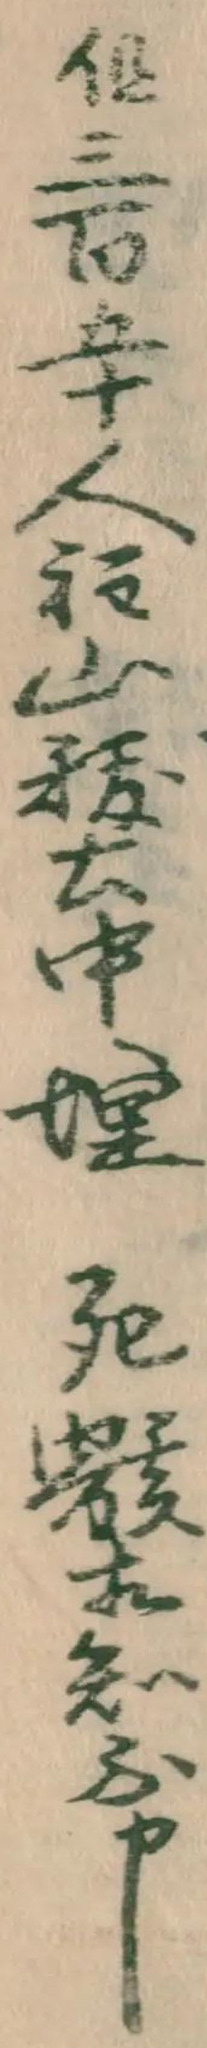但三百五十人程山抜土中へ埋死骸相知不申
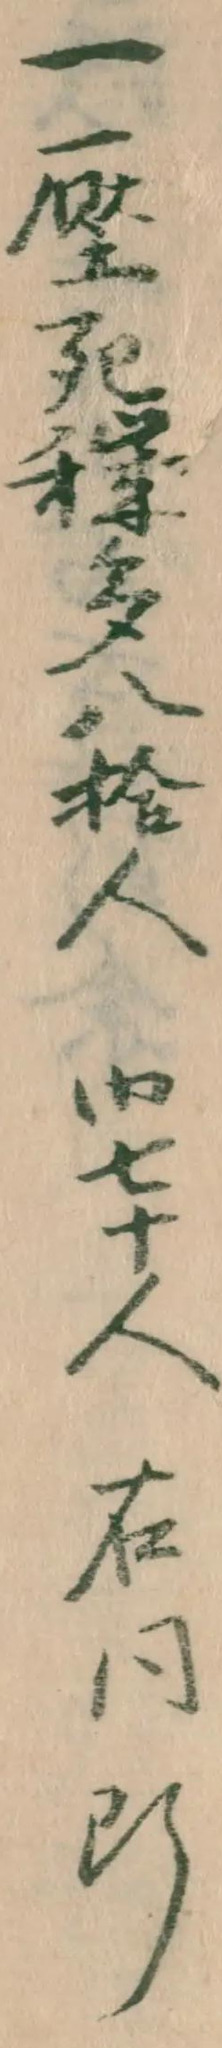一圧死人穢多八拾人内七十人右同断
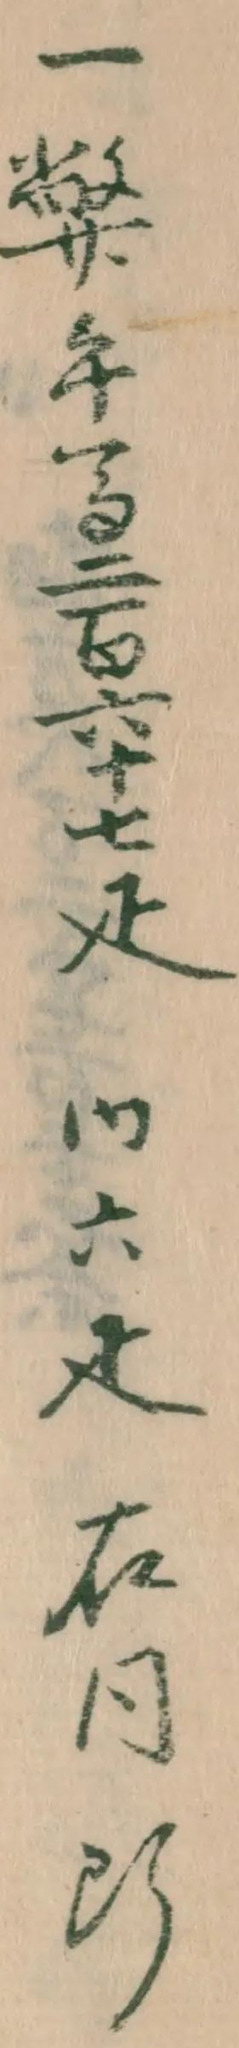一弊牛馬二百六十七疋内六疋右同断
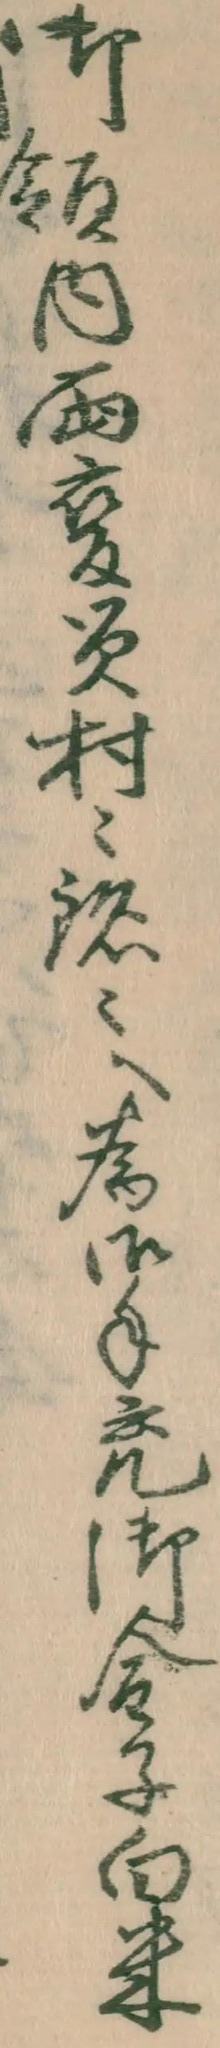御領内両変災村々銘々へ御手充御金子白米
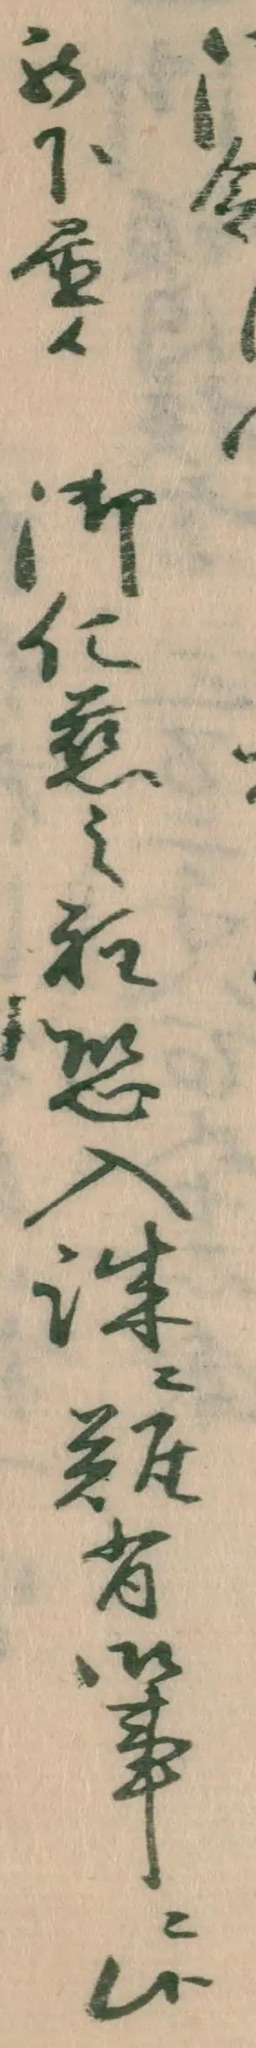被下置候御仁恵之程恐入誠二難有御事二候
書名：大地震
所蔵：国立国会図書館 National Diet Library, JAPAN
